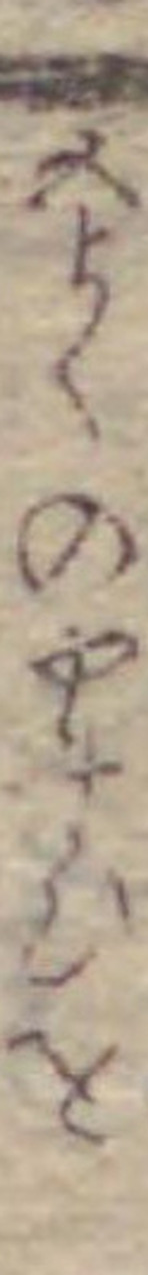五よくのやまひを
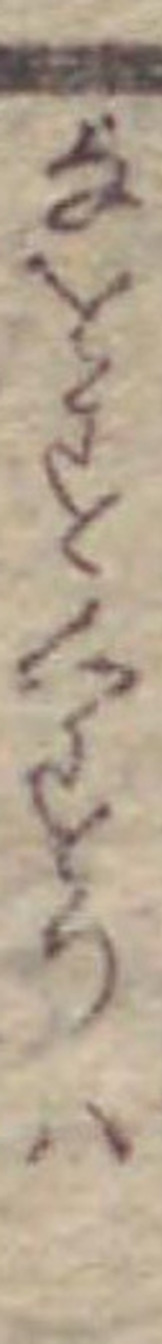なをすくすりは
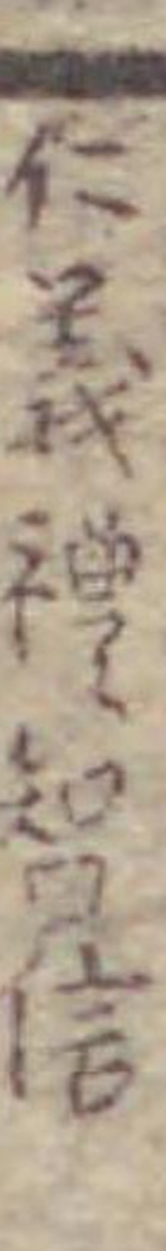仁義礼智信
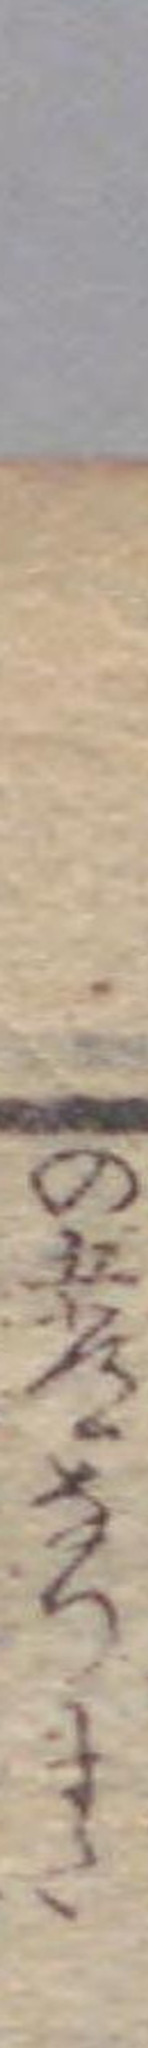の五道なりまた
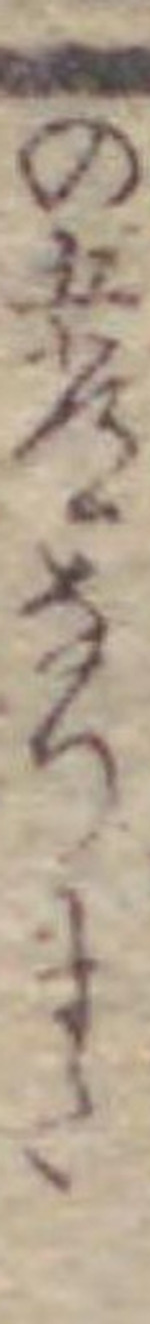の五道なりまた
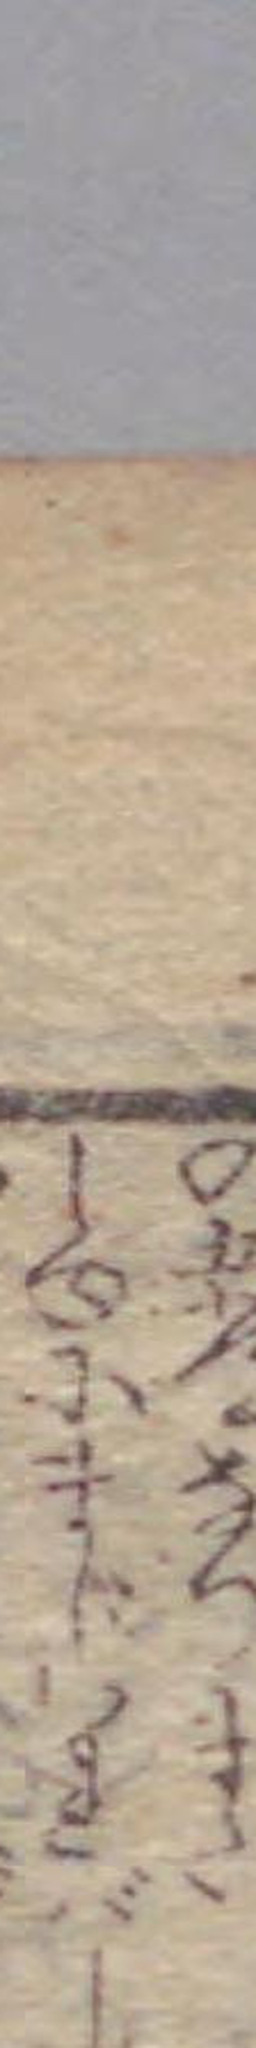しゆにまじはれば
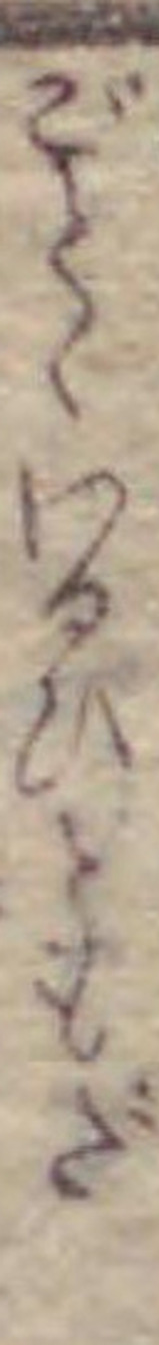ごとくわるひともだ
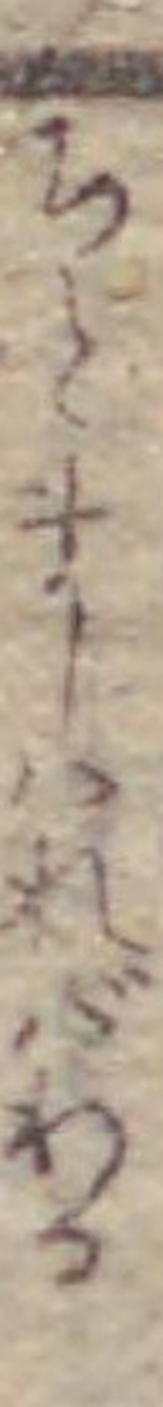ちとましはればわる
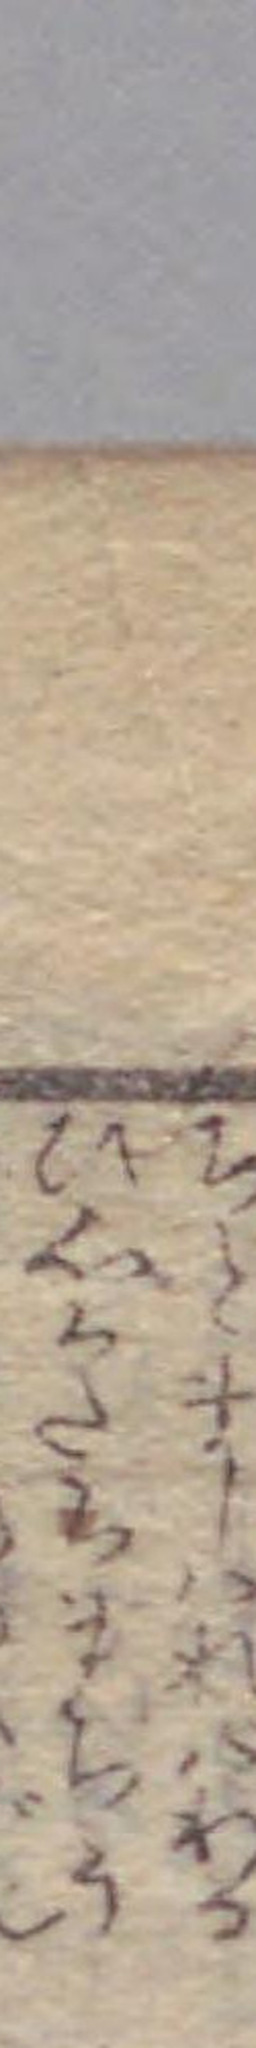ひ心かたちまちう
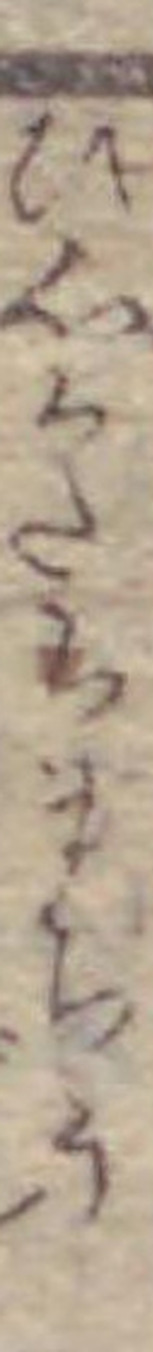ひ心かたちまちう
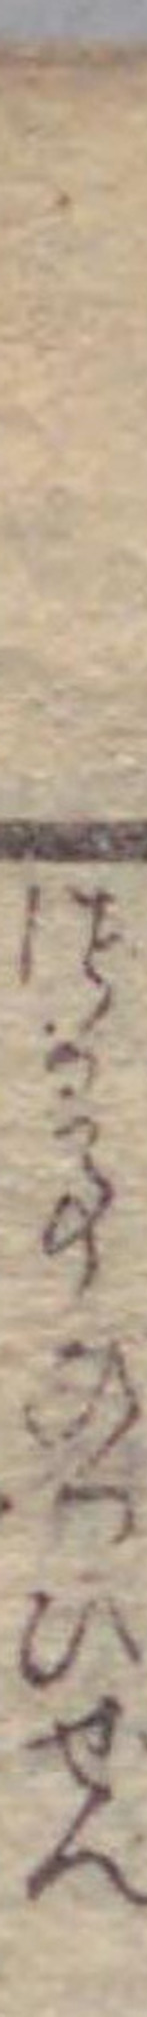つる事のつひぜん
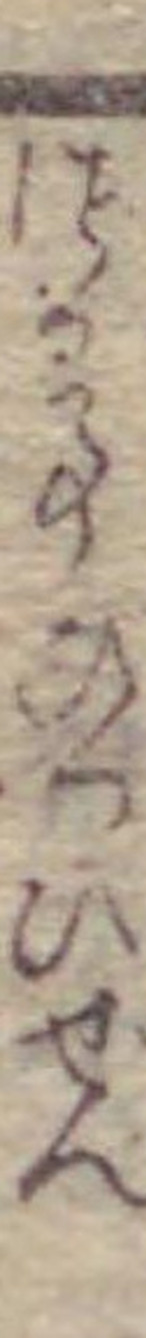つる事のつひぜん
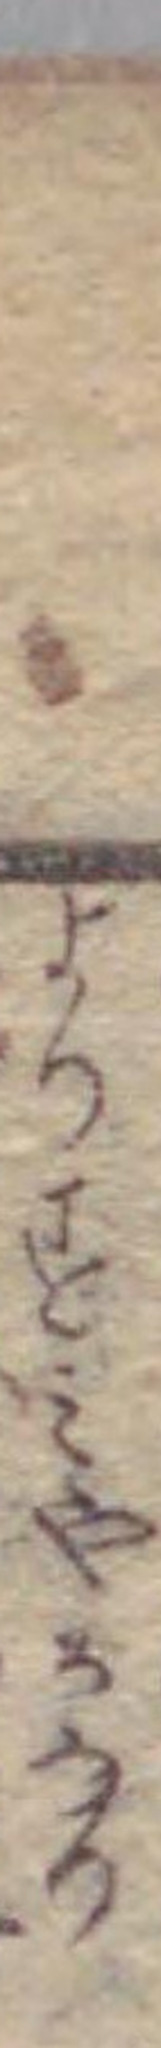よりすみやかなり
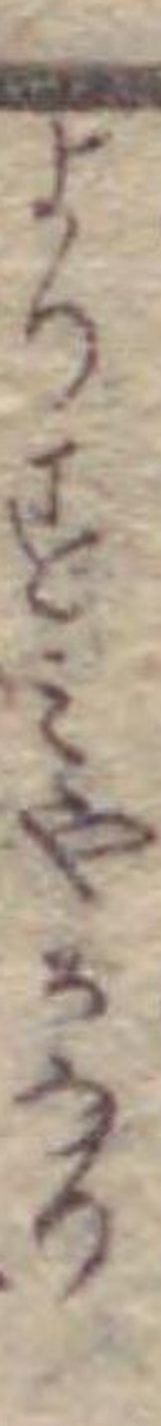よりすみやかなり
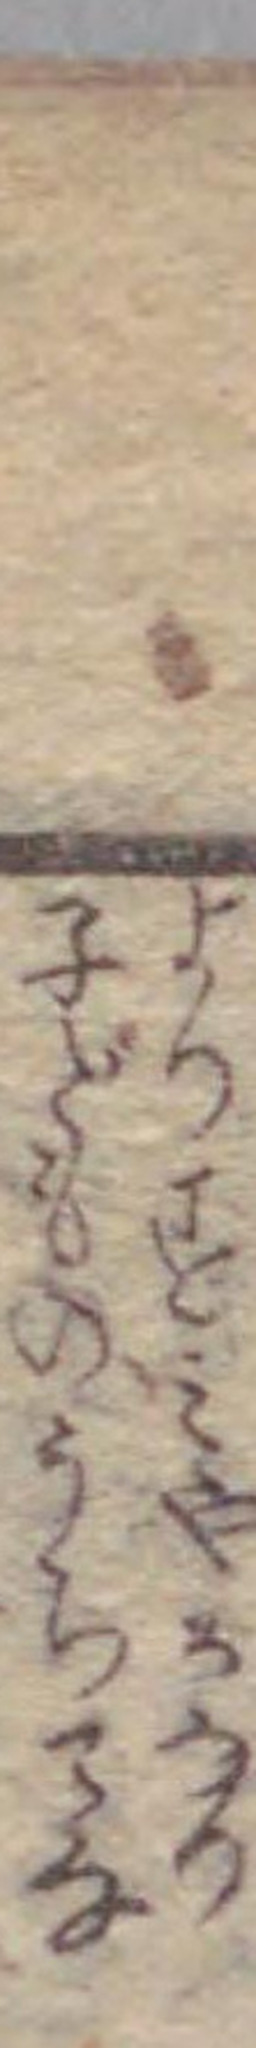子どものうちてな
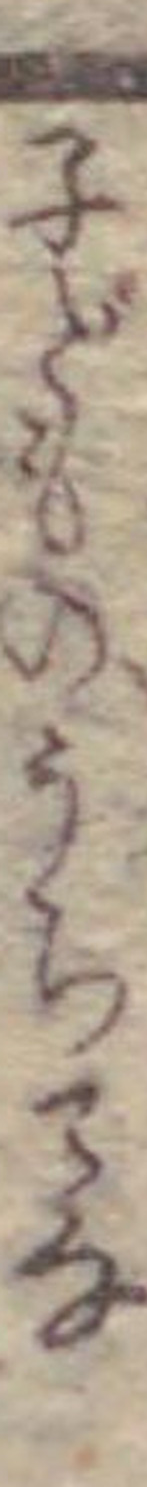子どものうちてな
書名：鼻下長生薬 : 3巻
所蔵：国立国会図書館 National Diet Library, JAPAN
